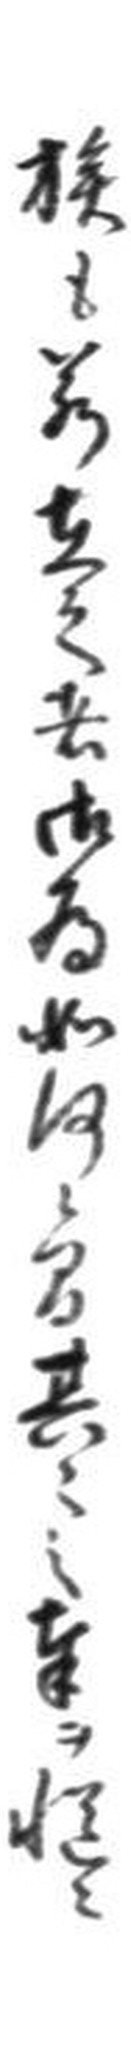族も若在之者御為如何候間其々之奉ヲ慥ニ
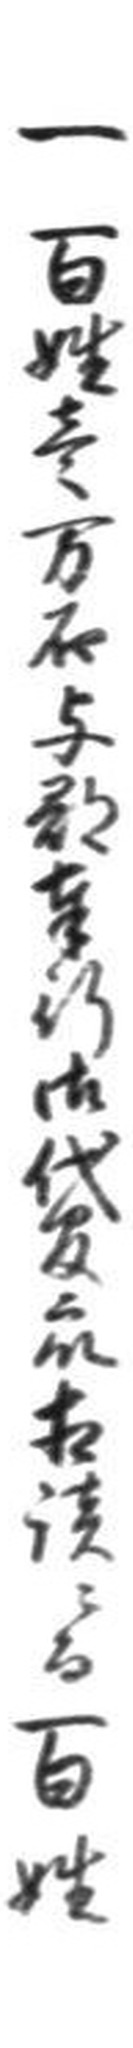一百姓壱万石与郡奉行御代官衆相談ニ而百姓
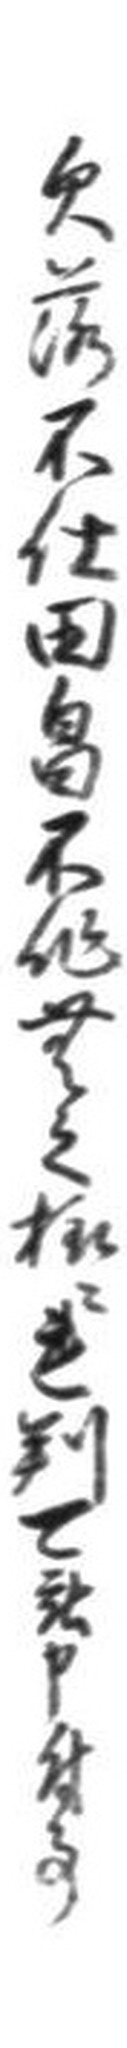欠落不仕田畠不作無之様ニ連判可被申付事
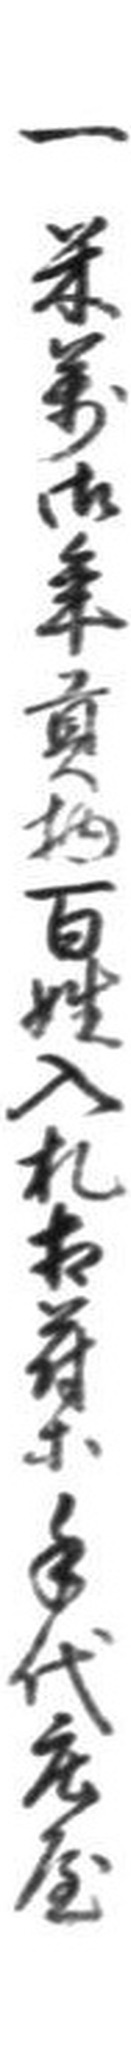一米万御年貢物百姓入札相符等手代庄屋
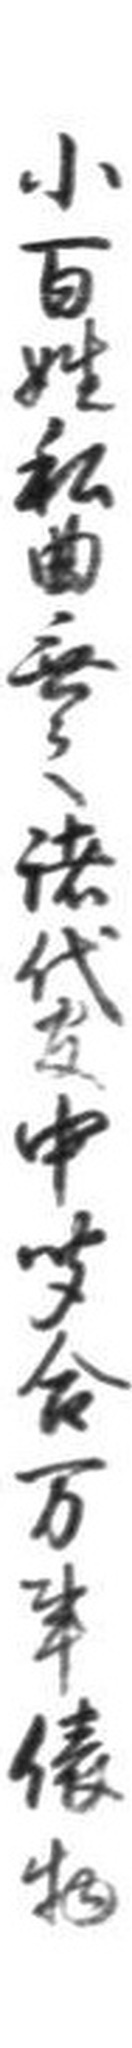小百姓私曲無之諸代官中聞合万事俵物
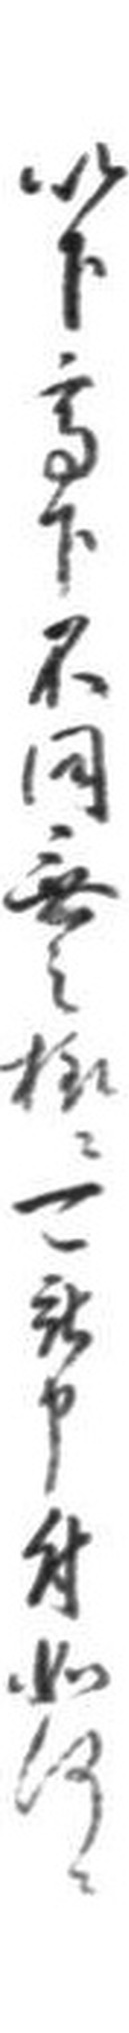以下高下不同無之様ニ可被申付如何ニ
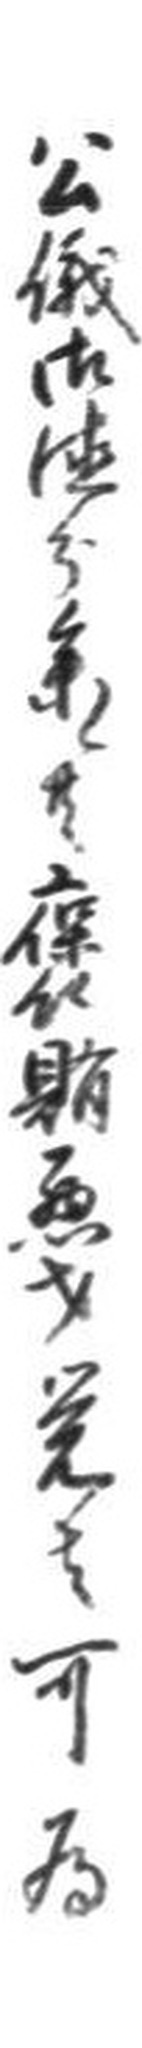公儀御徳分参候共褒賄悪才覚は可為

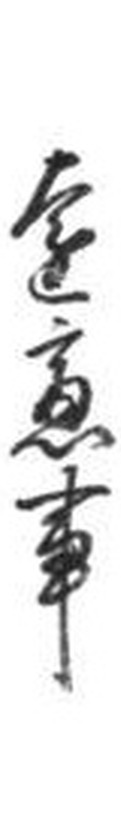遠慮事
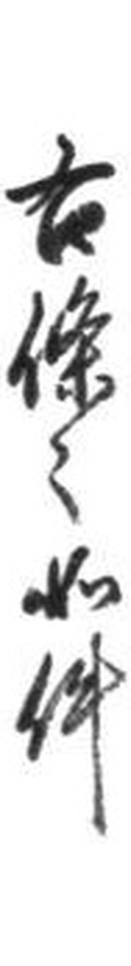右条々如件
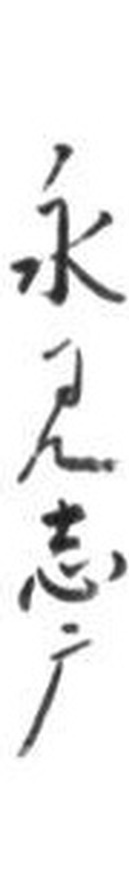永見志摩
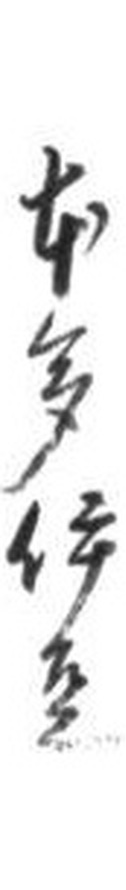本多伊豆
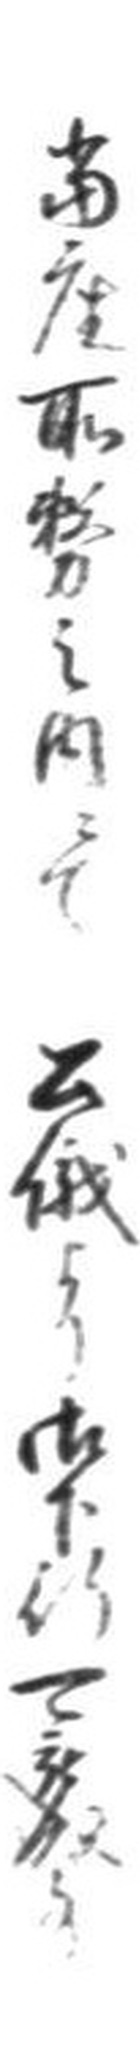当座所務之内ニて公儀より御下行可被成事
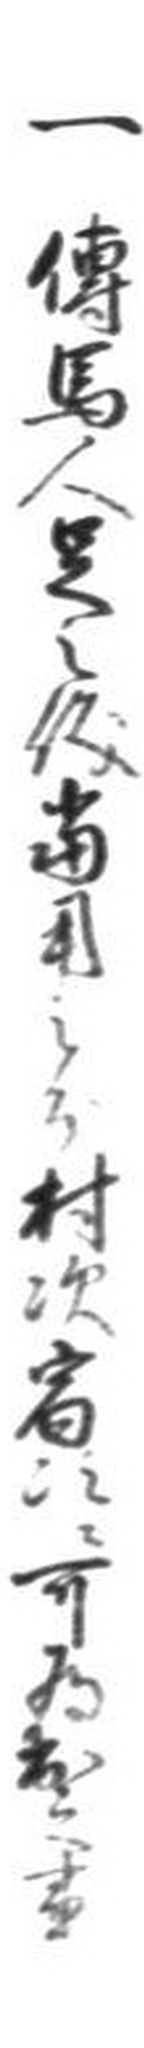一伝馬人足之儀当用之分村次宿次ニ可為出之事
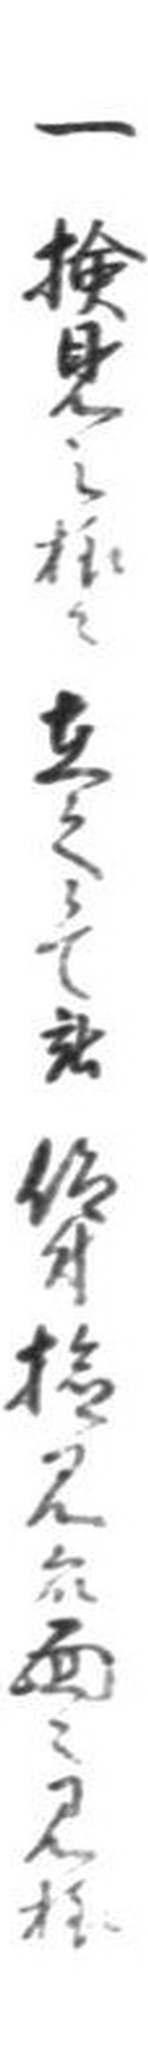一検見之様々在之ニて被仰付検見衆面々見様
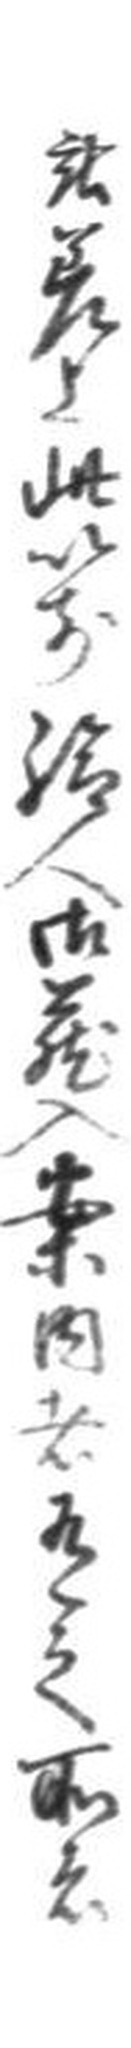被差上此以前給人御蔵入案内者有之所は
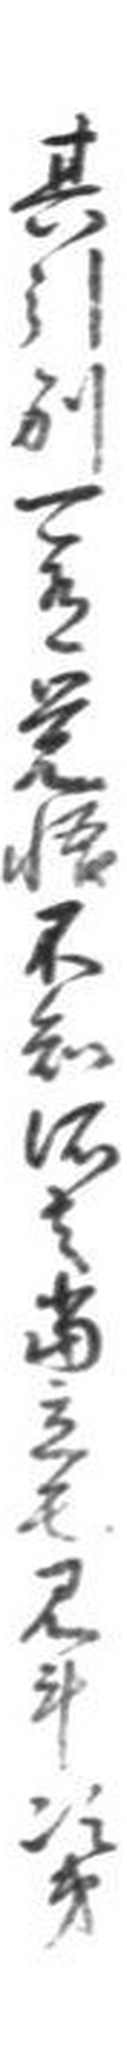其引別可有覚悟不知所は当立毛見斗次第
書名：家譜 三 忠昌公 従慶長八年到寛永六年
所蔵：福井県文書館 Fukui Prefectural Archives
